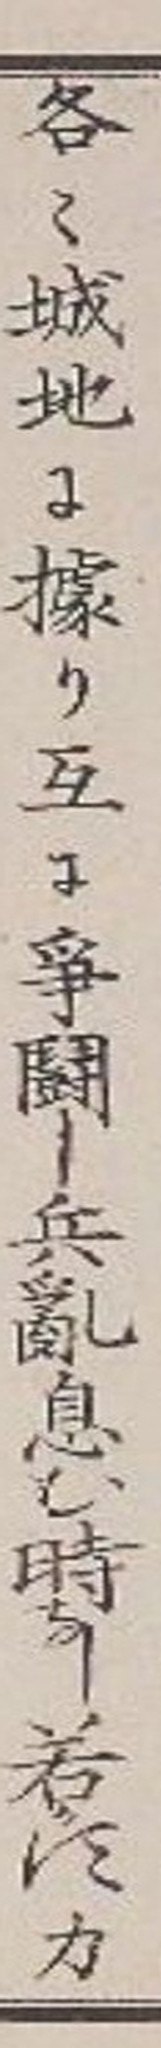各々城地に拠り互に争闘し兵乱息む時なし若かす力
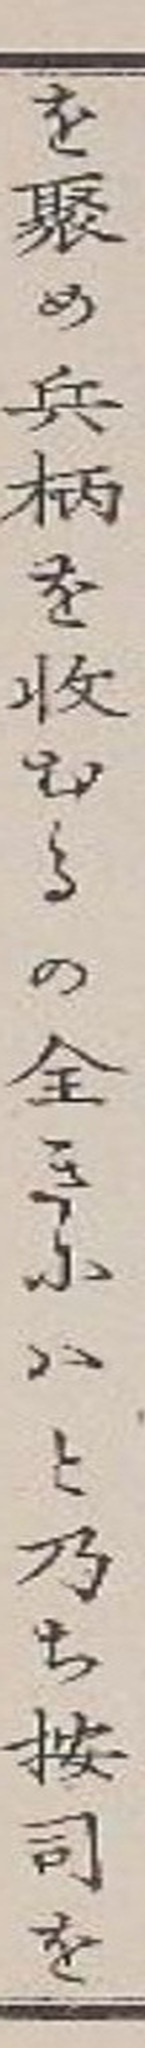を聚め兵柄を収むるの全きにはと乃ち按司を
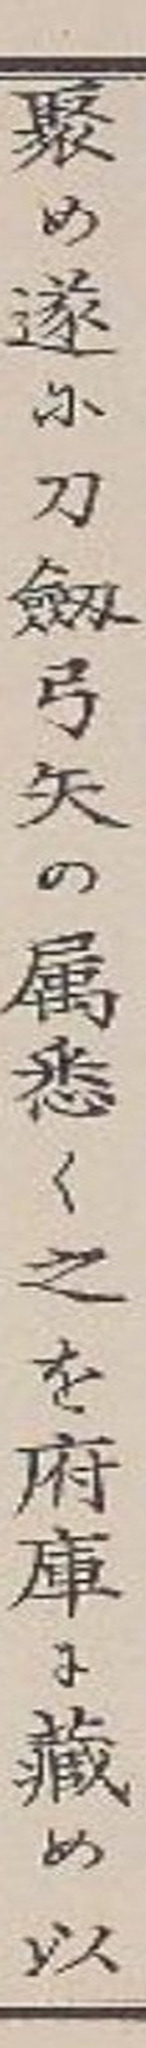聚め遂に刀劔弓矢の属悉く之を府庫に蔵め以
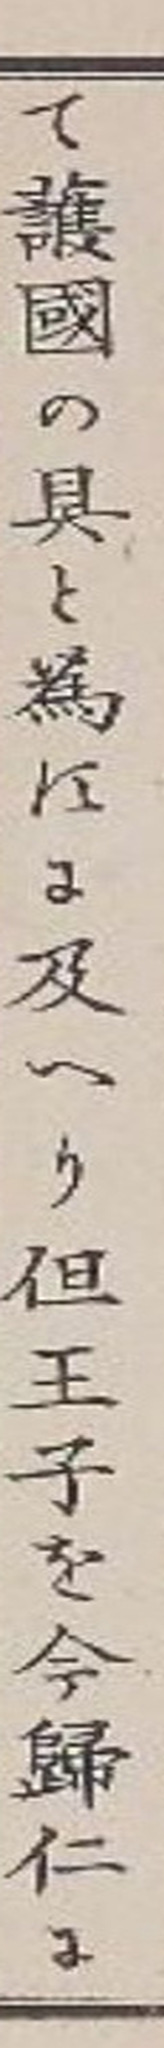て護国の具と為すに及へり但王子を今帰仁に
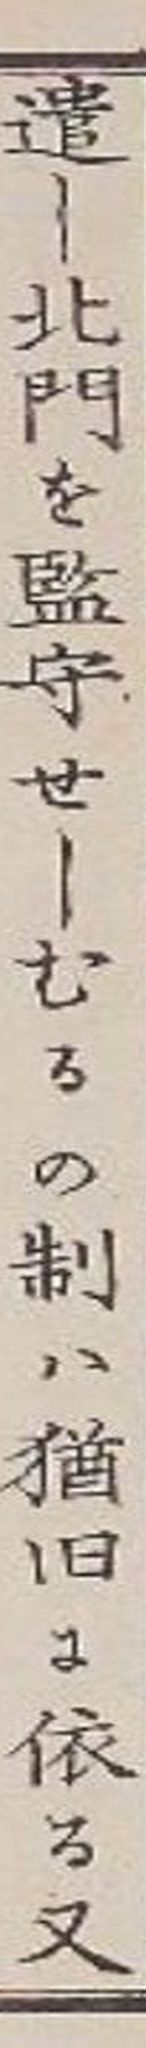遣し北門を監守せしむるの制は猶旧に依る又
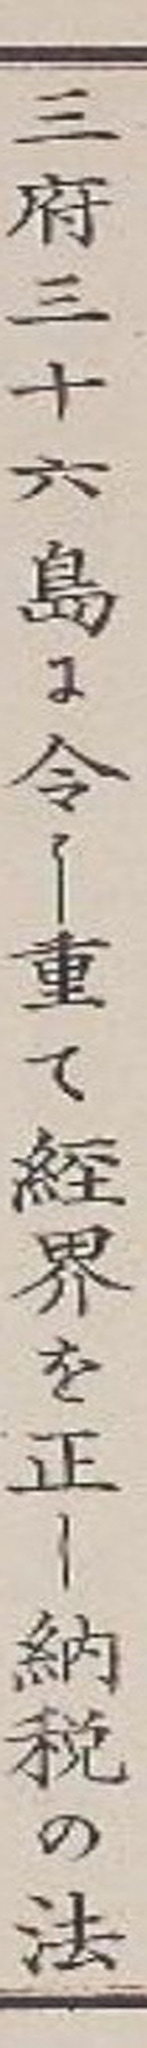三府三十六島に令し重て経界を正し納税の法
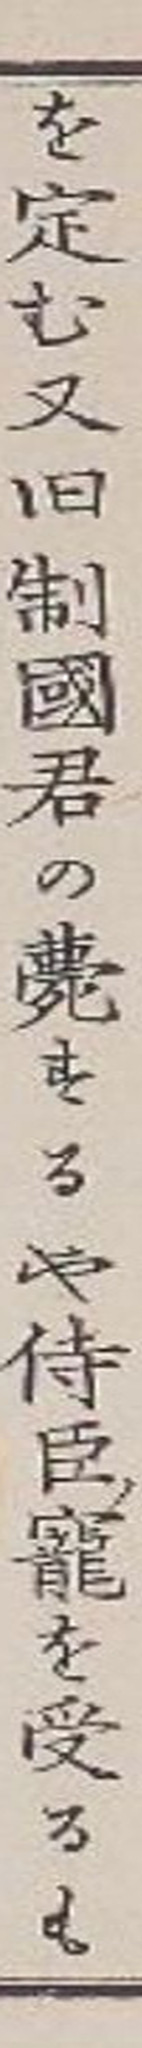を定む又旧制国君の薨するや侍臣寵を受るも
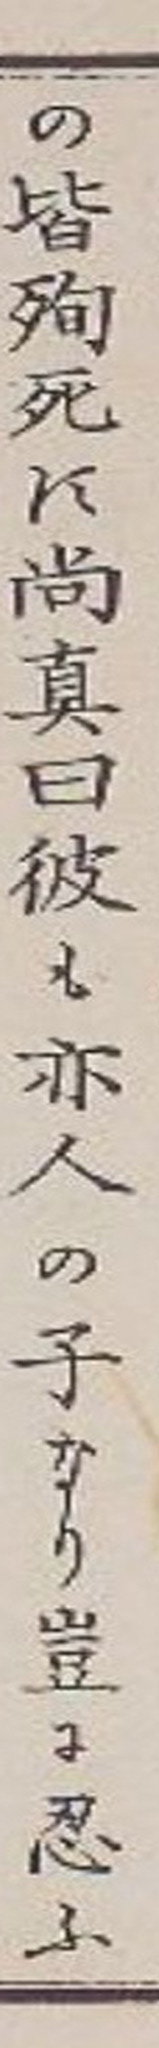の皆殉死す尚真曰彼も亦人の子なり豈に忍ふ
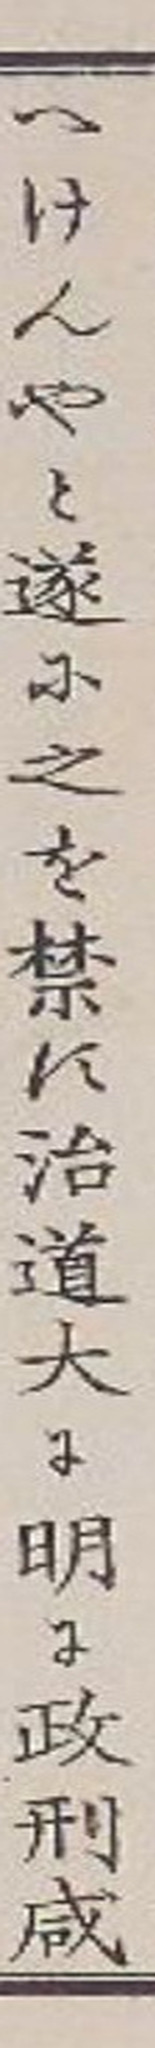へけんやと遂に之を禁す治道大に明に政刑咸
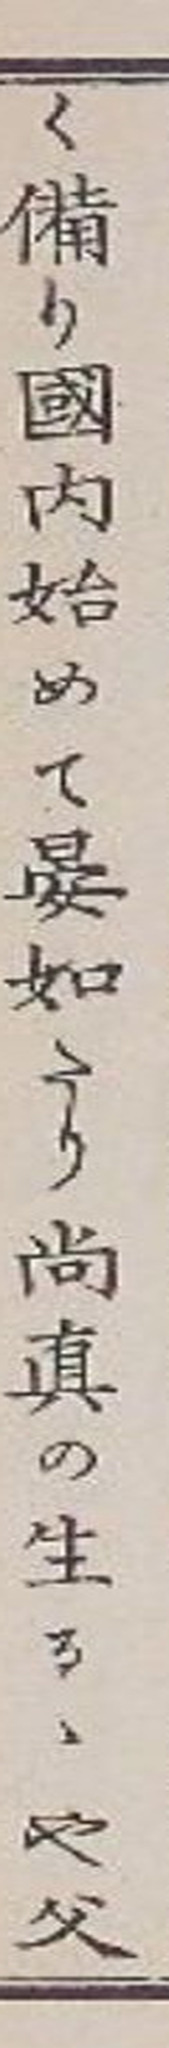く備り国内始めて晏如たり尚真の生るゝや父
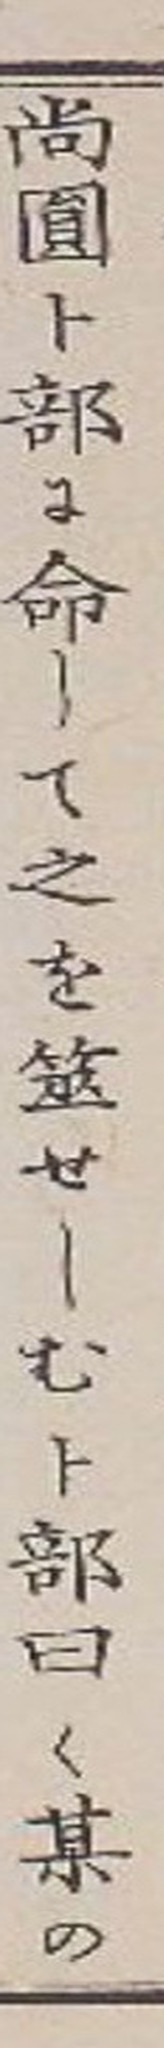尚円卜部に命して之を筮せしむ卜部曰く某の
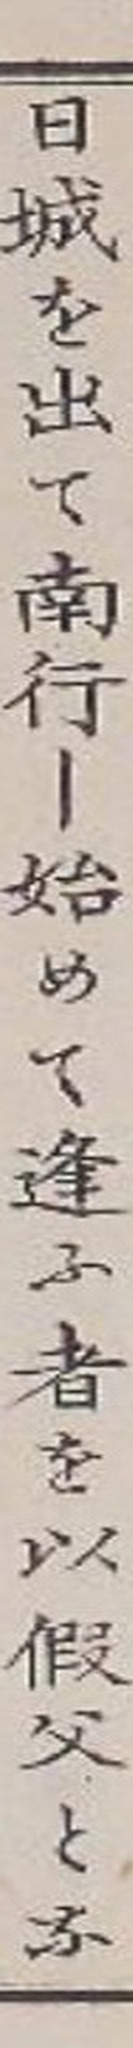日城を出て南行し始めて逢ふ者を以仮父とな
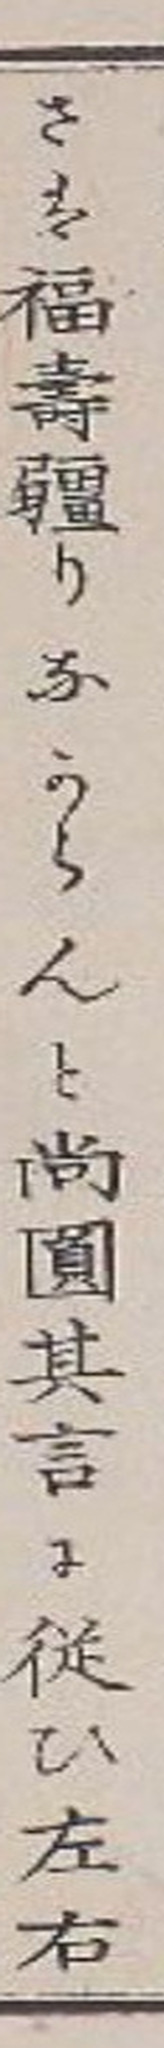さす福寿彊りなからんと尚円其言に従ひ左右
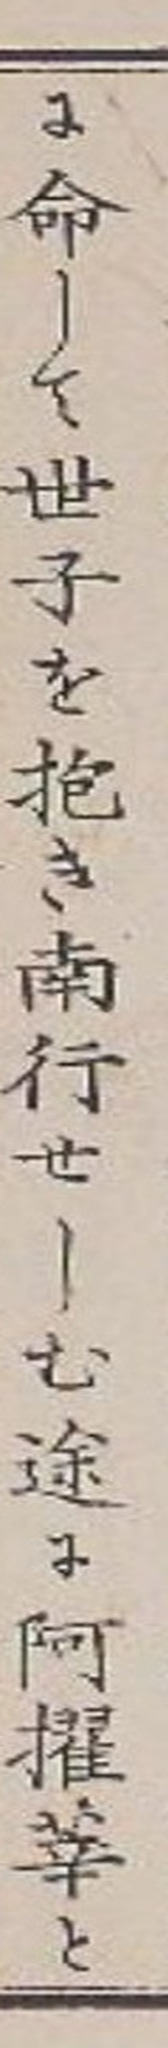に命して世子を抱き南行せしむ途に阿擢莘と

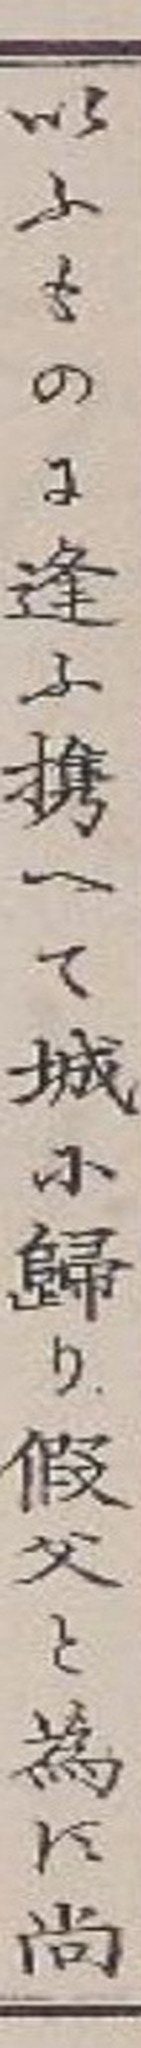いふものに逢ふ携へて城に帰り仮父と為す尚
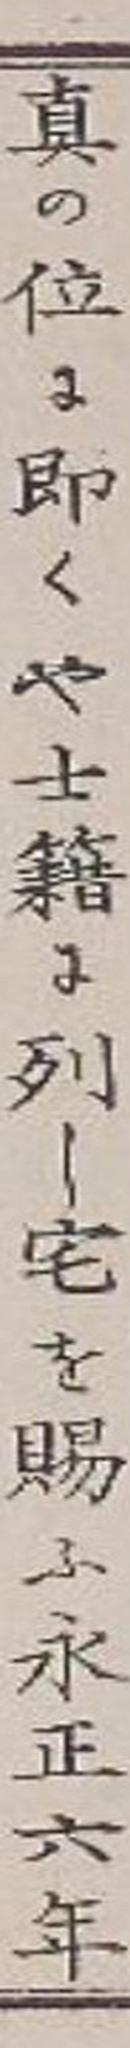真の位に即くや士籍に列し宅を賜ふ永正六年
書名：南島紀事 中
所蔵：University of the Ryukyus Library
